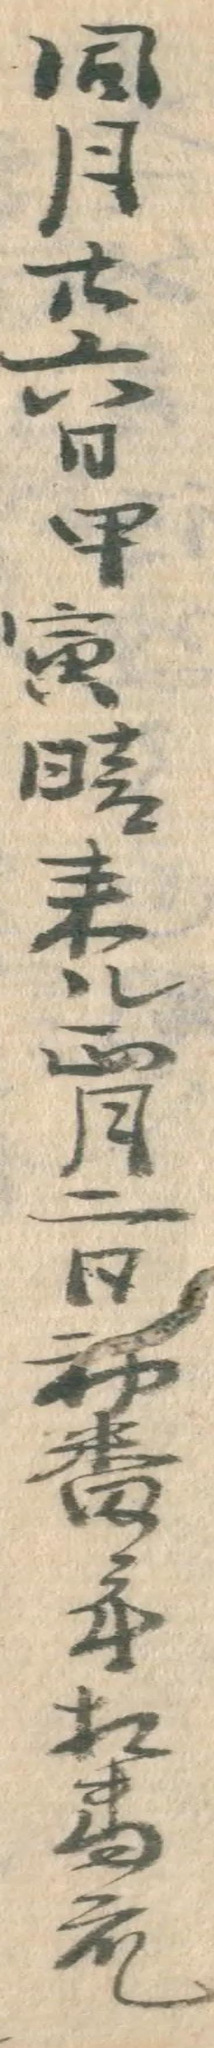同月廿六日甲寅晴、来ル正月二日初番ニ付、相番衆
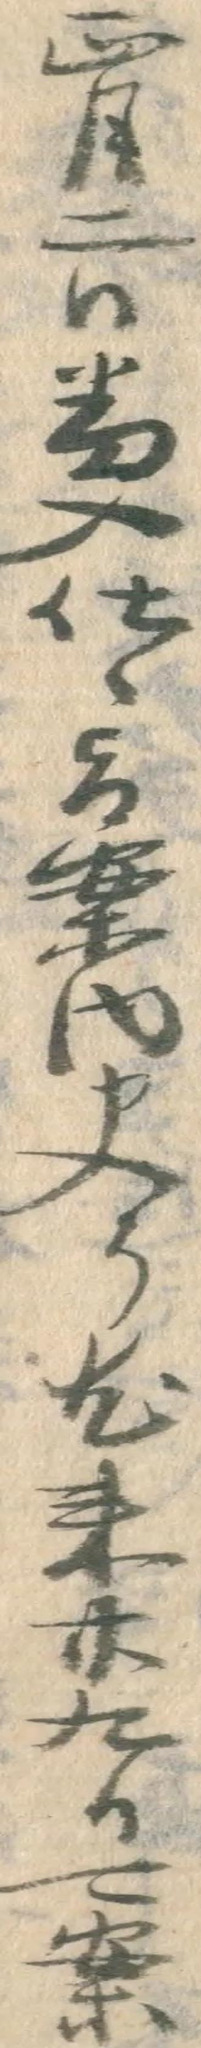正月二日番入仕候旨案内申入了、尤来廿九日可案
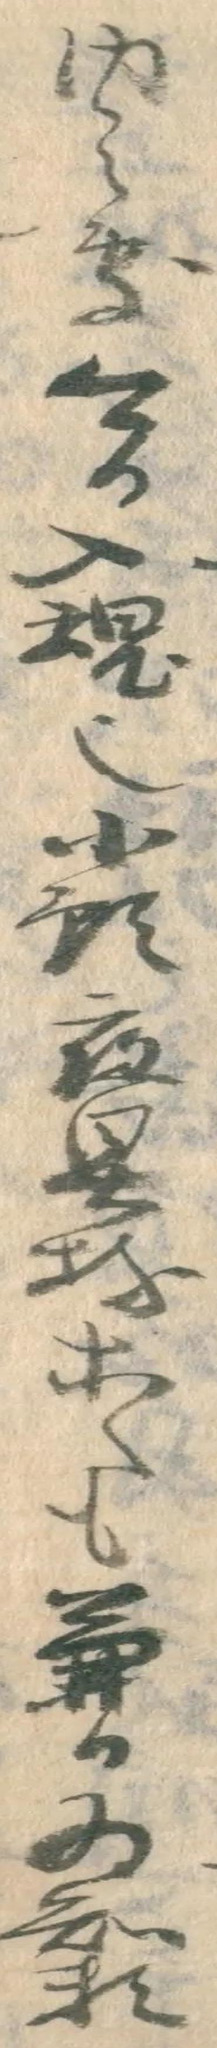内之処、今日入魂也、小預夜具持出候も、兼而為知頼

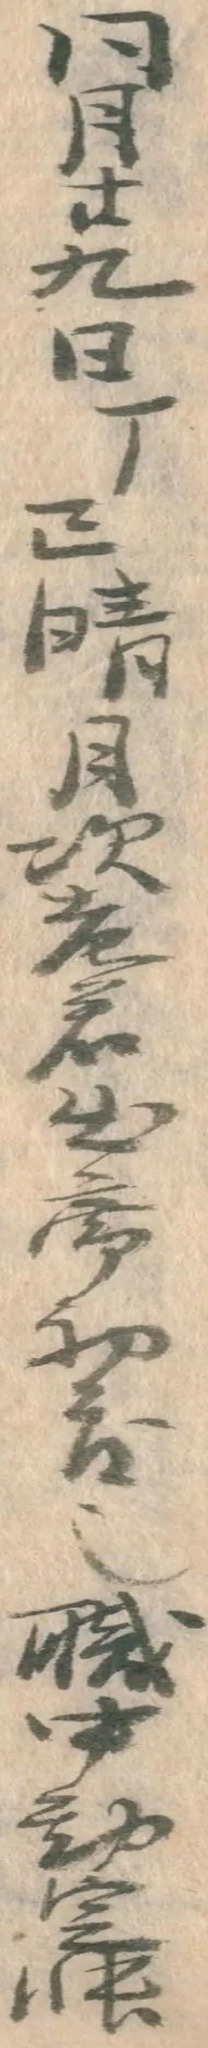同月廿九日丁巳晴、月次老若出席、初度也、職中勘定帳
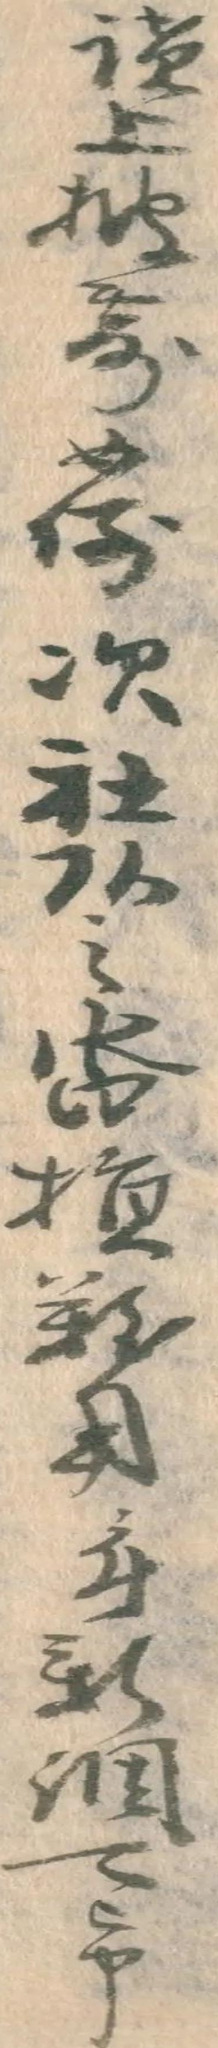読上披露如例、次社頭之沓損難用ニ付、新調可被申
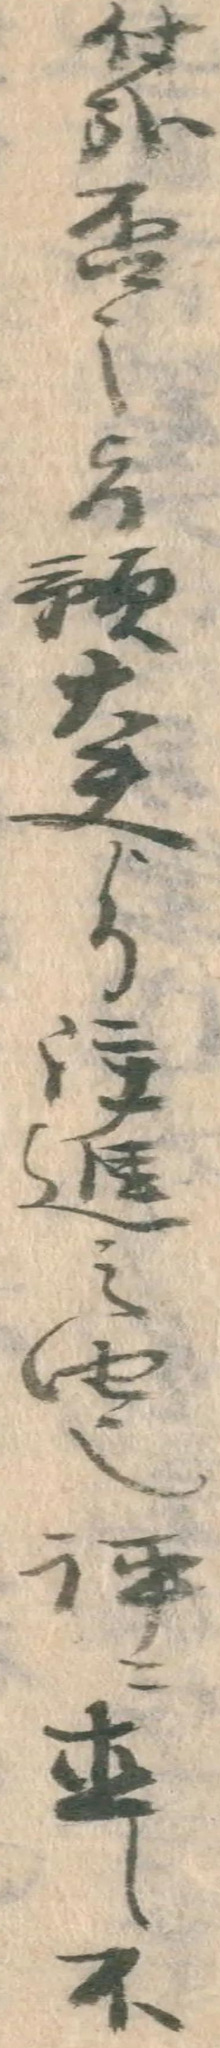付哉否之旨、預大夫より注進之由也、評二、直し不
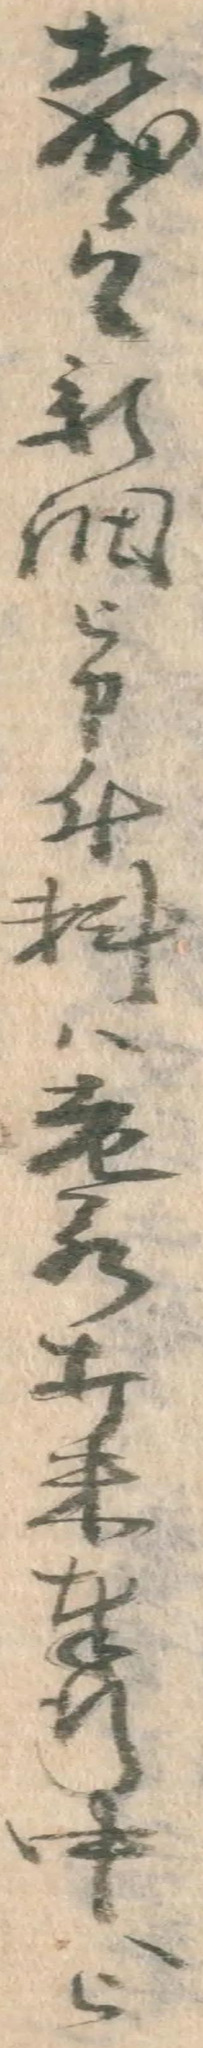相成候ハゝ新調被申付、料ハ老若打来奉行中へ被
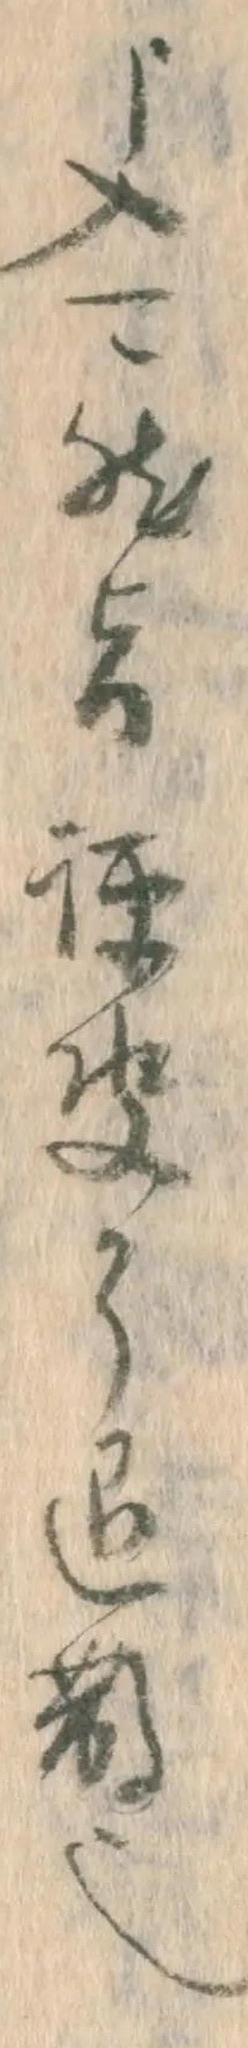申入可然旨評決了、退散也、
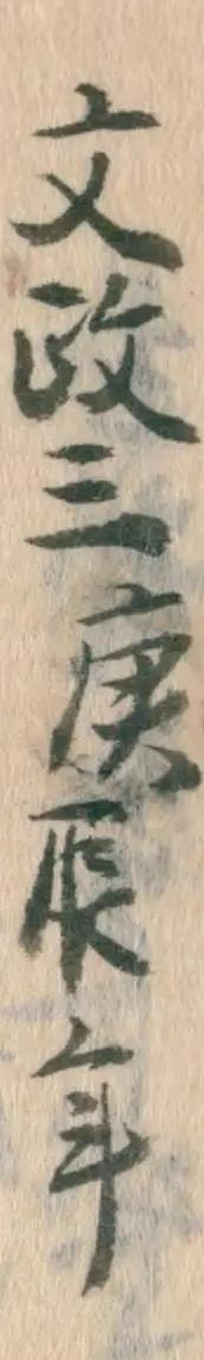文政三庚辰年
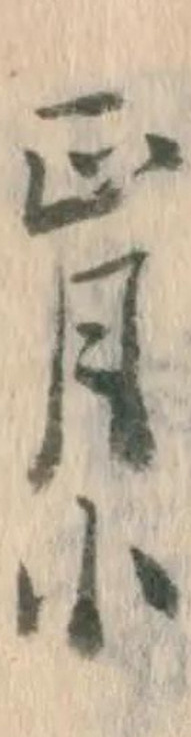正月小
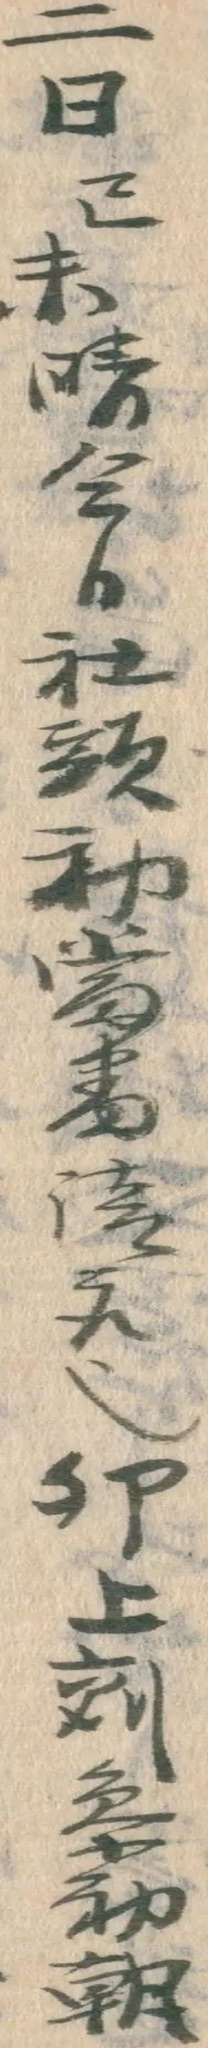二日己未晴、今日社頭初当番請取也、卯上刻参、初朝
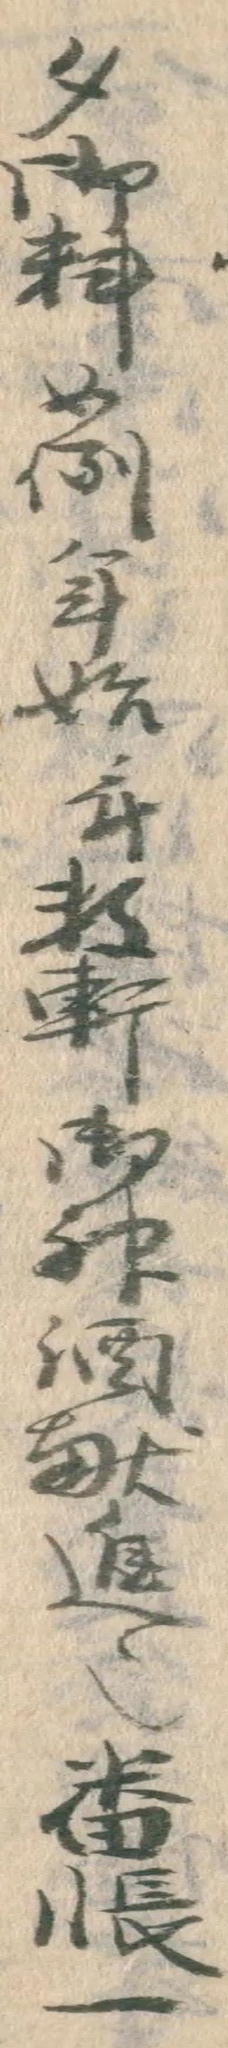夕御料如例、年始ニ付数軒御神酒献進也、番帳一
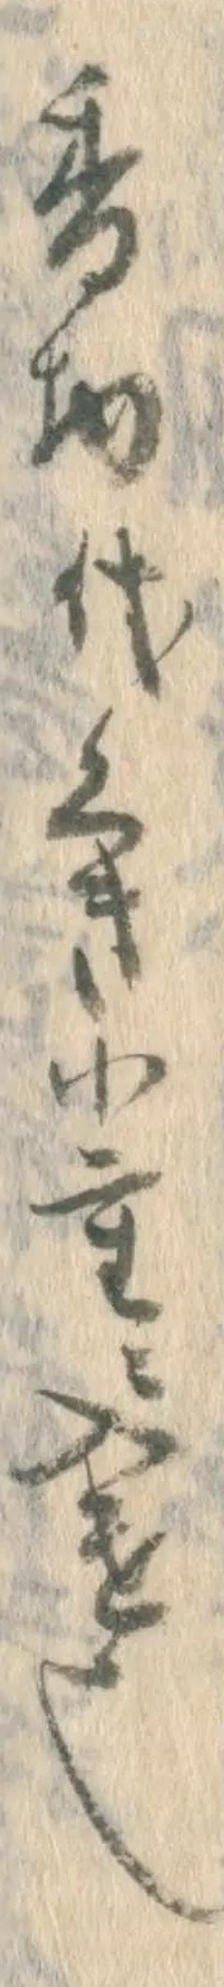香物代くき小重に入遣也、

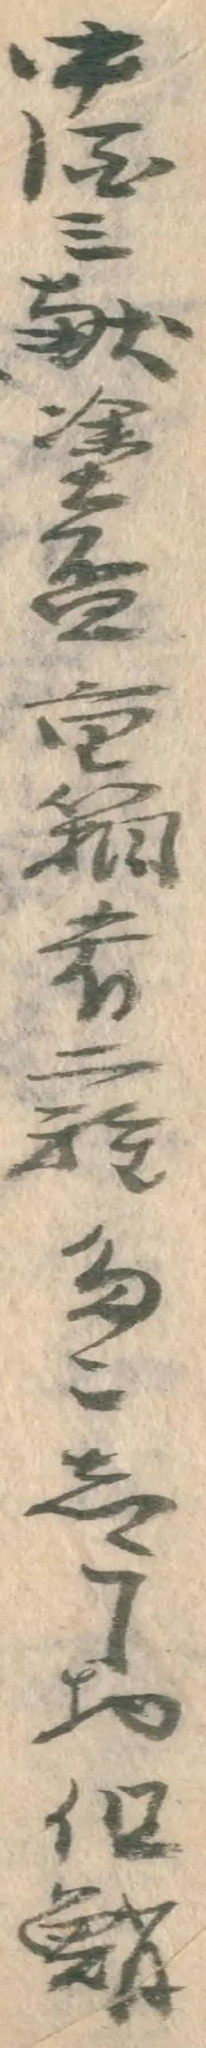煮染物中酒三献塗盃重箱肴二種多々したし物但鞘
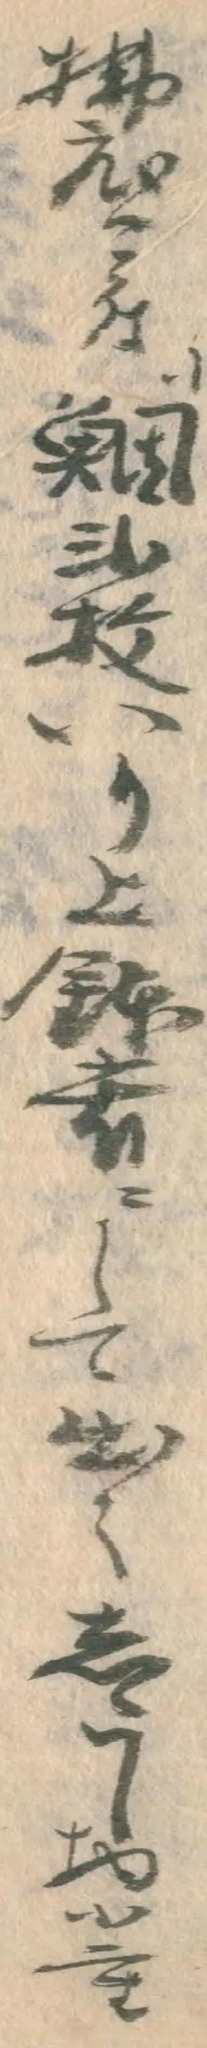払底ニ付鯛弐枚いり上鉢肴ニして出ししたし物小重
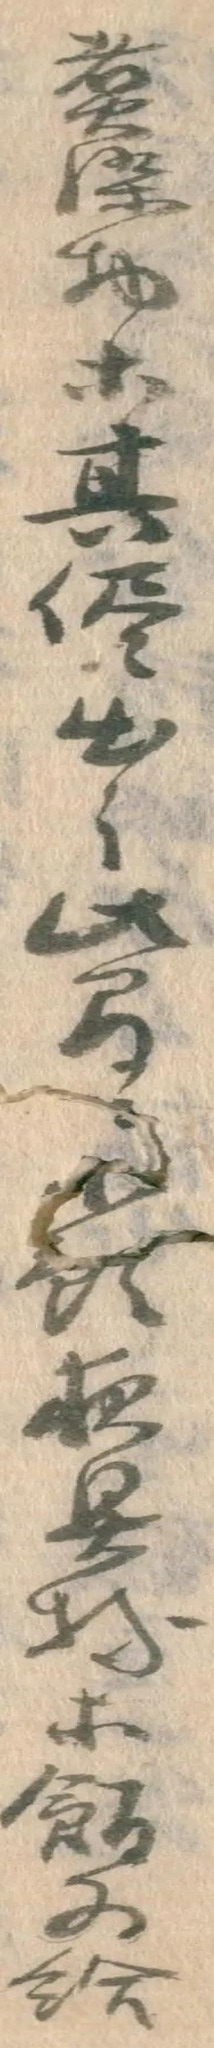煮染物等其儘出し、此間も御預夜具持等、飯見舞
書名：賀茂社記録. 第63冊
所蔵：国立国会図書館 National Diet Library, JAPAN
